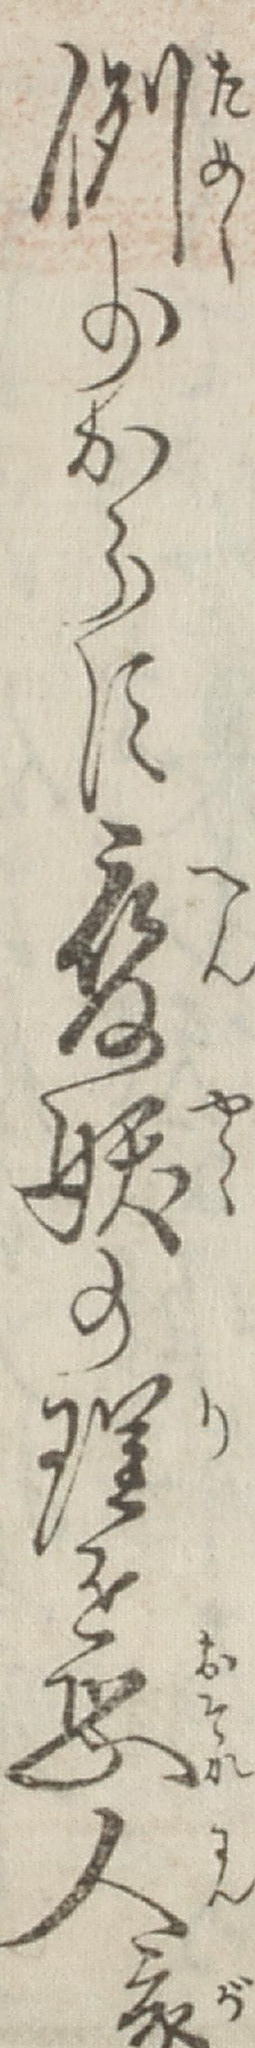例少からす変妖の理を恐人我
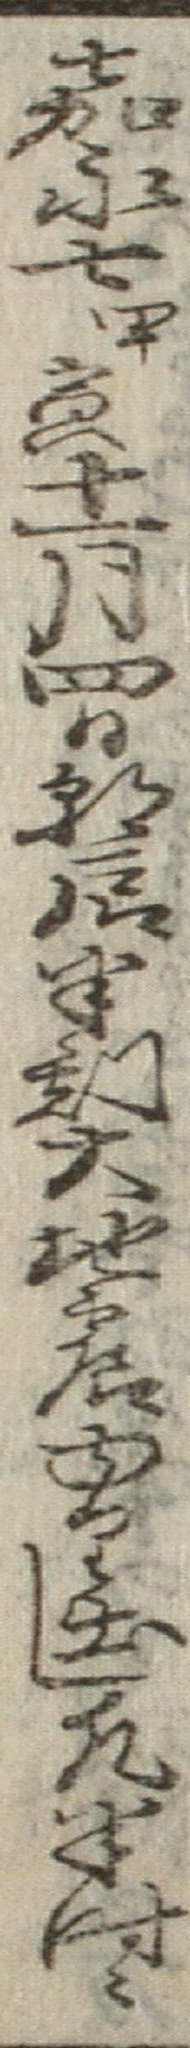嘉永七甲寅十一月四日朝辰半刻大地震ゆり出し凡半時ニ
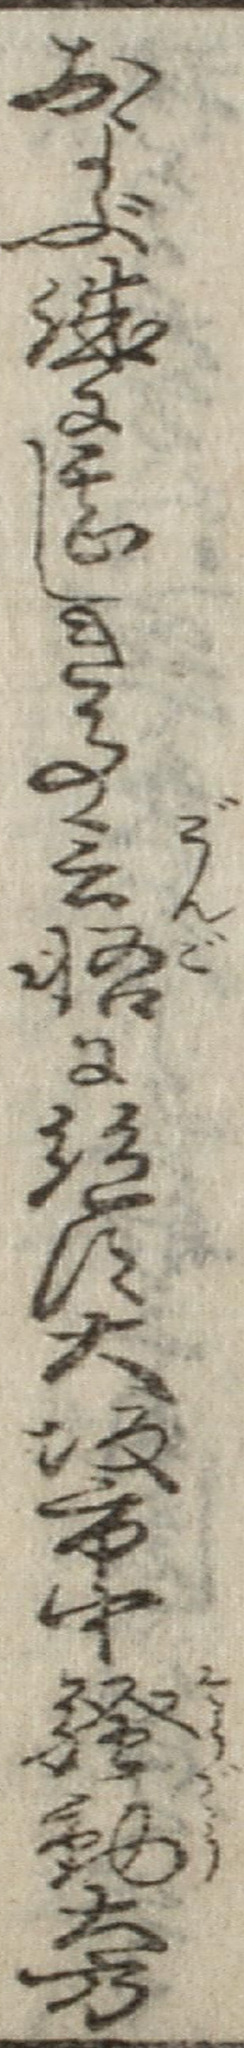およぶ誠に甚しき事言語に絶す大坂市中騒動大方
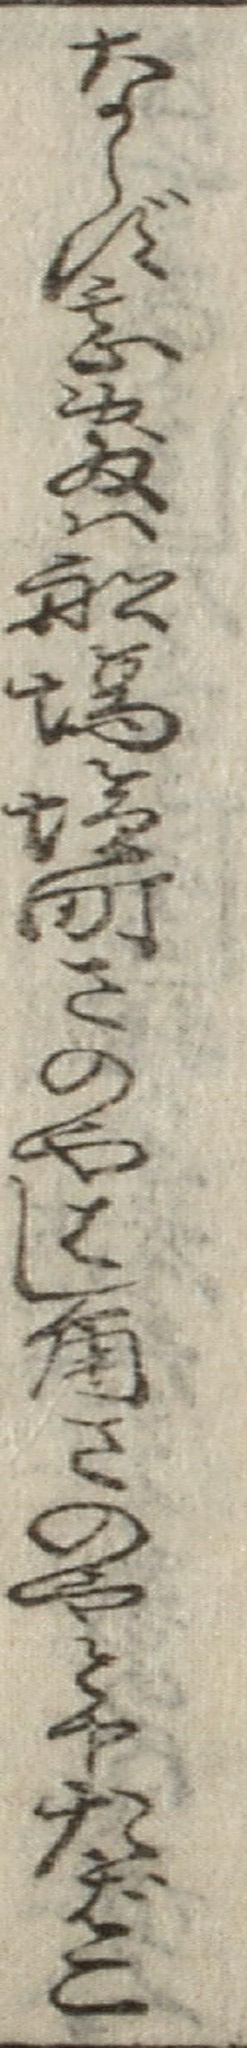ならず甚敷ハ船場塩町さのやはし角さのやと申たばこ
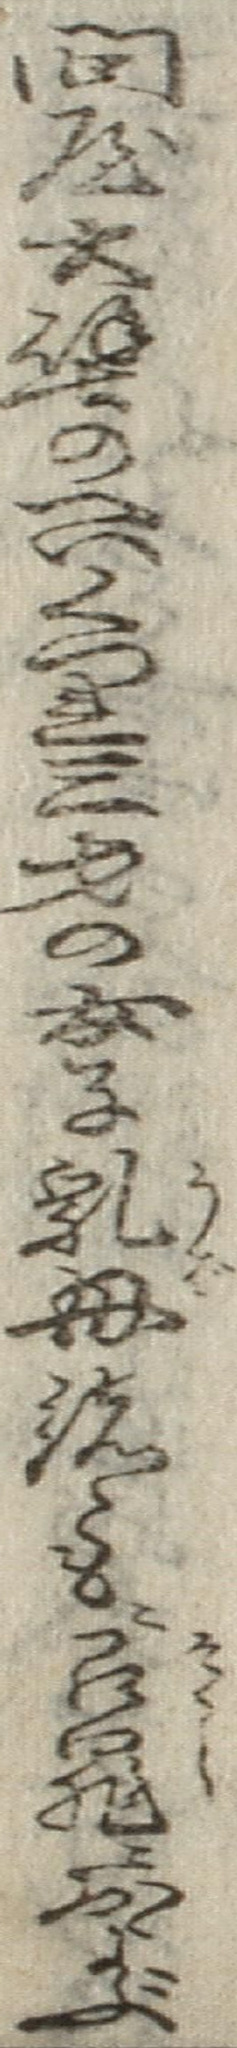問屋大壁のへいくつれ三才の女子乳母諸ともニ即死ニおよぶ
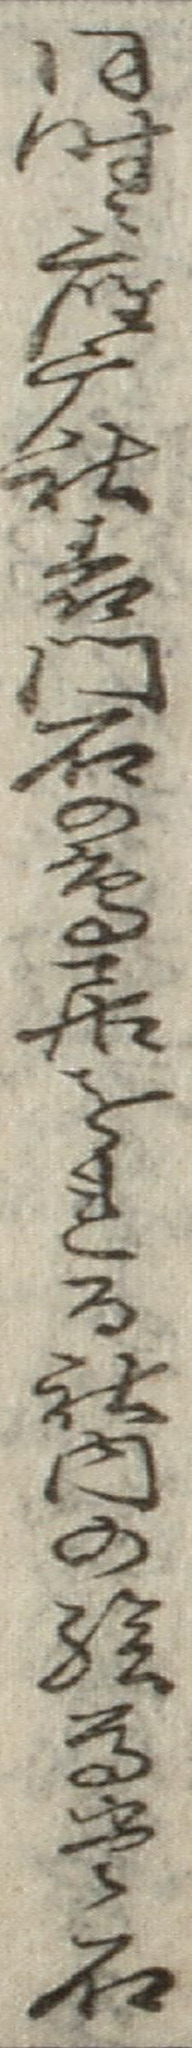同時ニ座摩社表門石の鳥居をれる社内の絵馬堂石
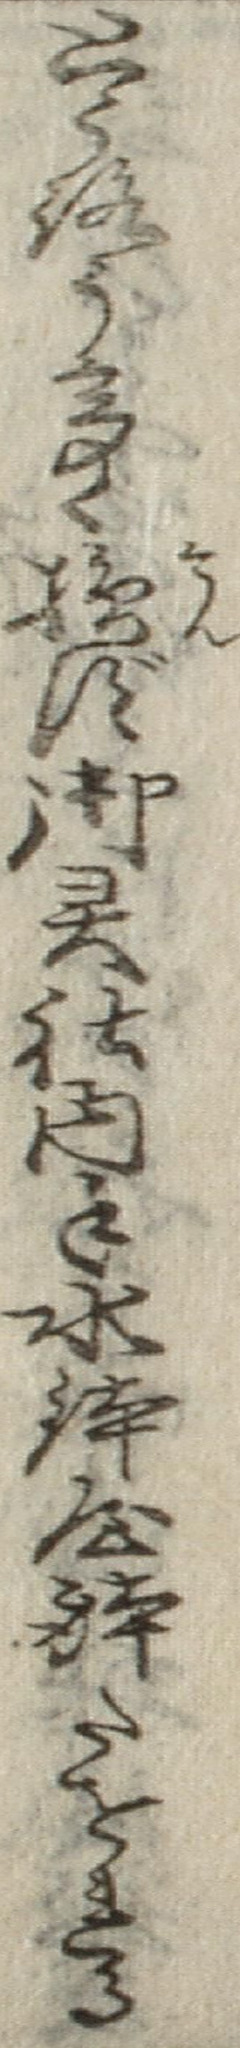とうろう多く損ず御霊社内手水鉢屋躰たをれる
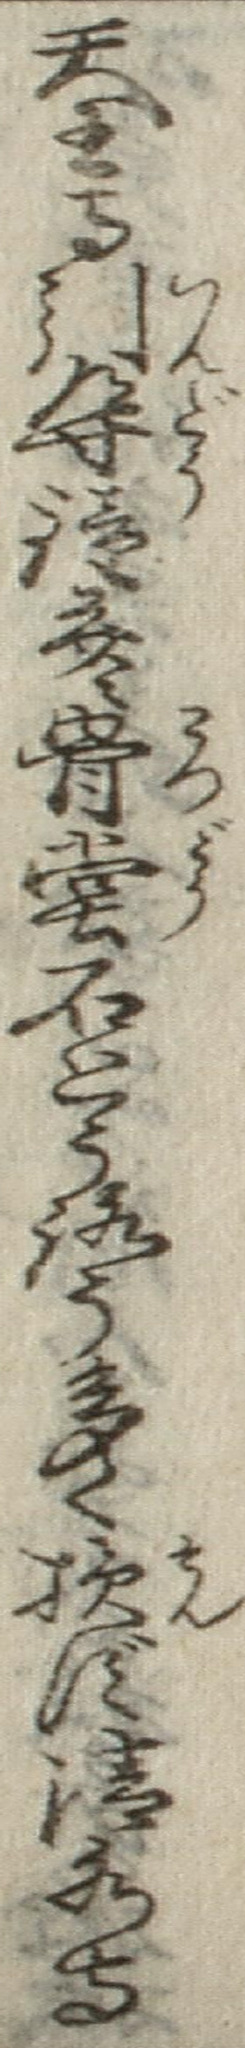天王寺引導鐘并ニ骨堂石とうろう多く損ず清水寺
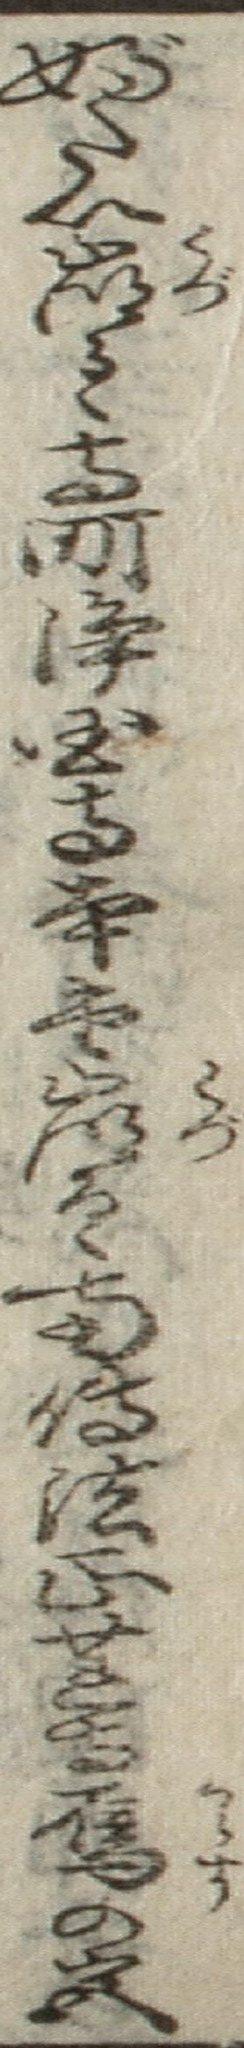ぶたい崩るゝ寺町浄国寺本堂崩るゝ南傳法正蓮寺烏の宮

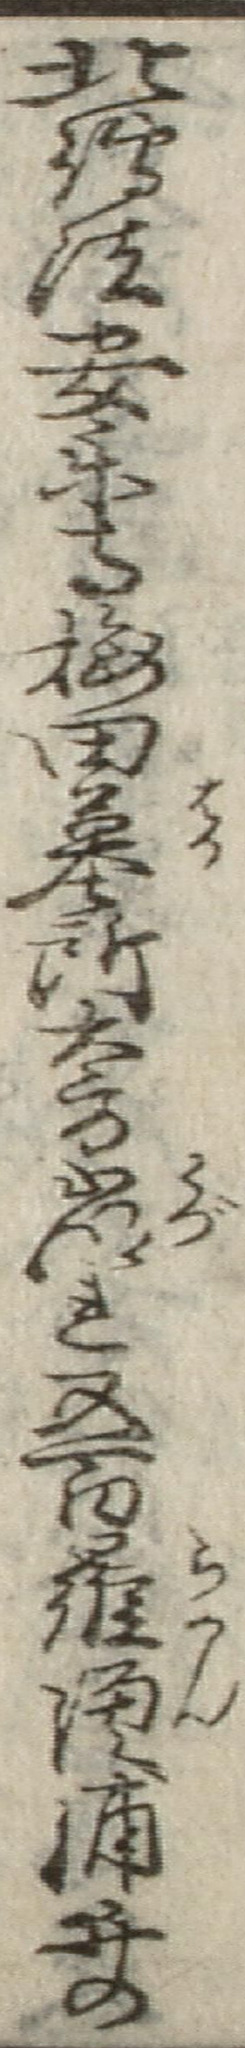北傳法安楽寺梅田墓所大方崩れ五百羅漢浦井の
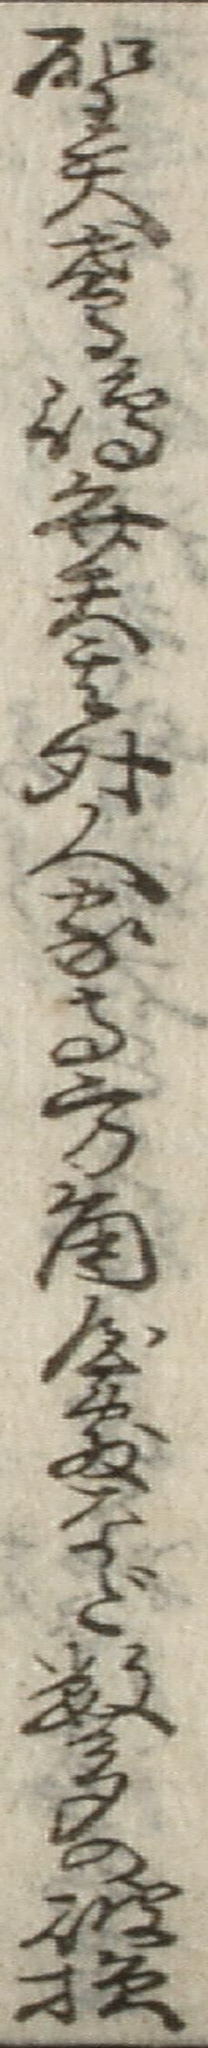聖天鳶嶋弁天其外人家寺方角屋敷など数多の破損
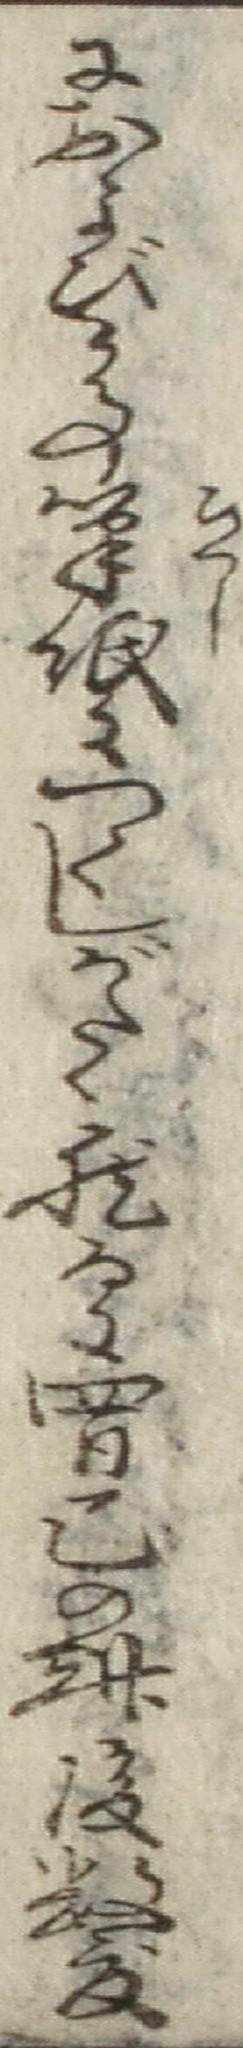に及候事筆紙につくしがたく然るに四月巳の刻後数度
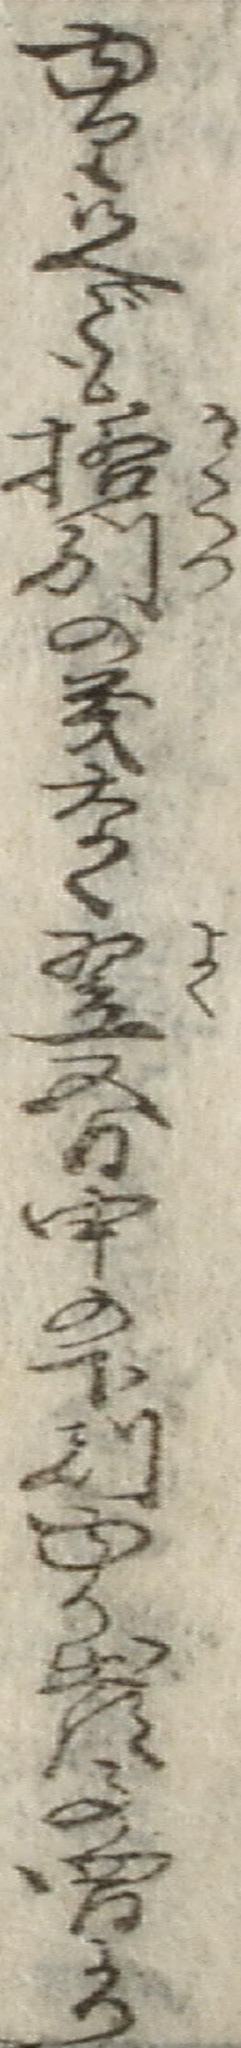ゆり候へども格別の義なく翌五日申の下刻ゆり出すこの四日より
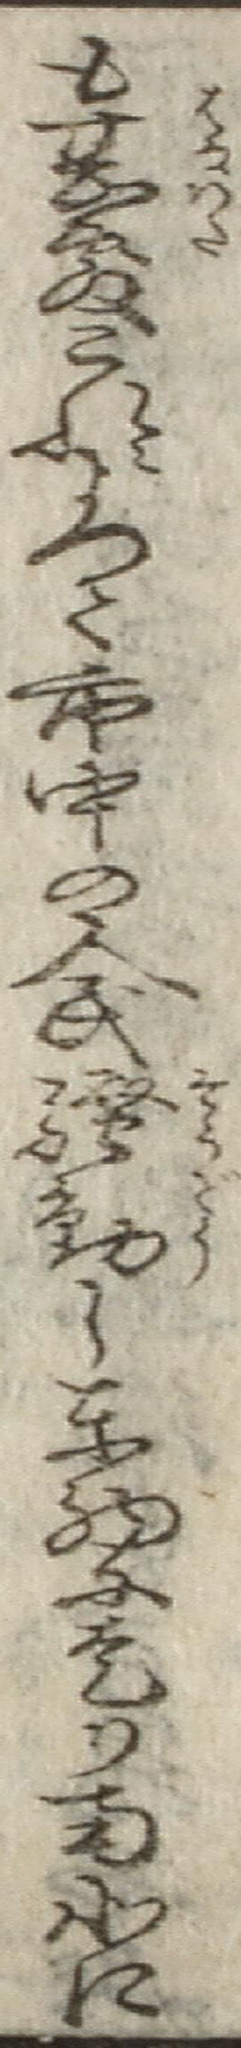も甚敷これニよつて市中の人民騒動し東西に走り南北に
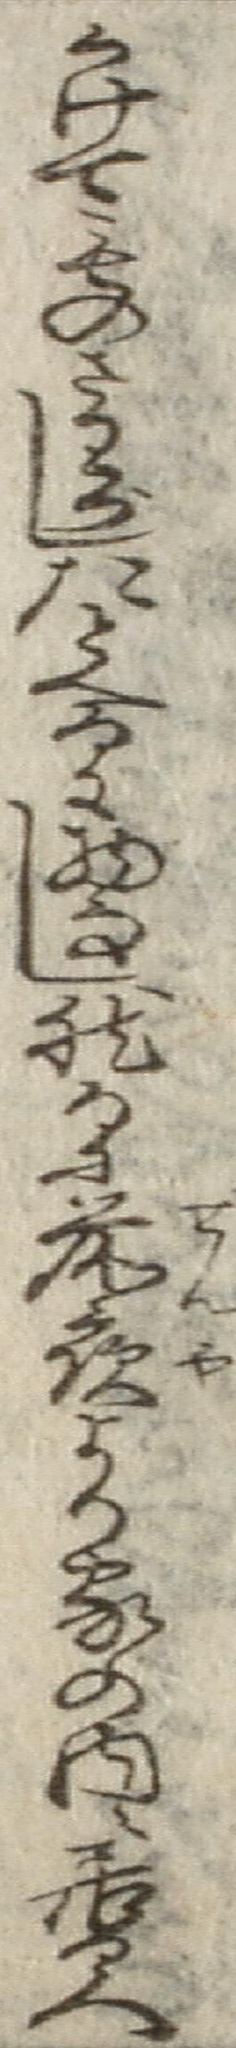かけてものさわがしたとへるに物なし然るに前夜より家の内ニ居る人
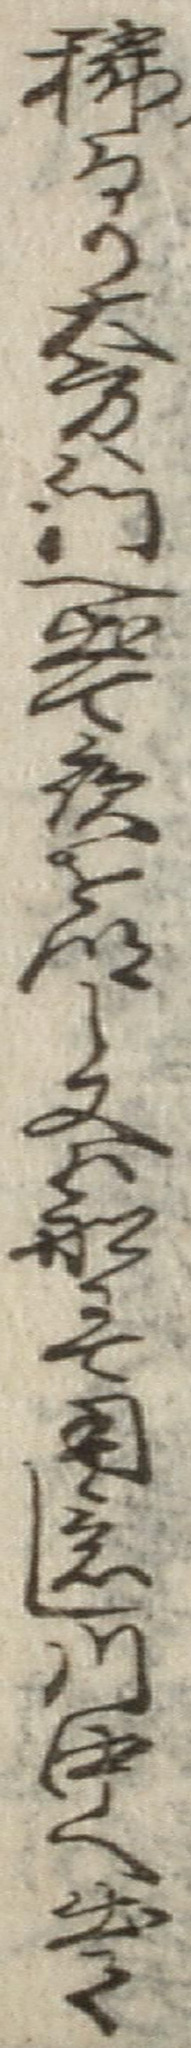稀なり大方ハ門へ出て夜を明し又ハ船にて用意し川中へ出て
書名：世直り艸紙
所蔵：東京大学地震研究所図書室 Earthquake Research Institute Library, The University of Tokyo, JAPAN
